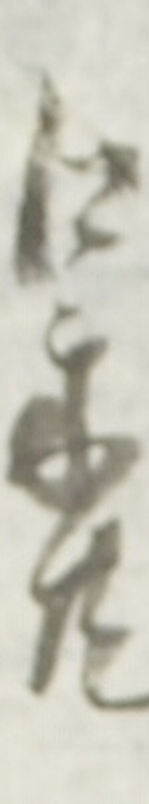口米共
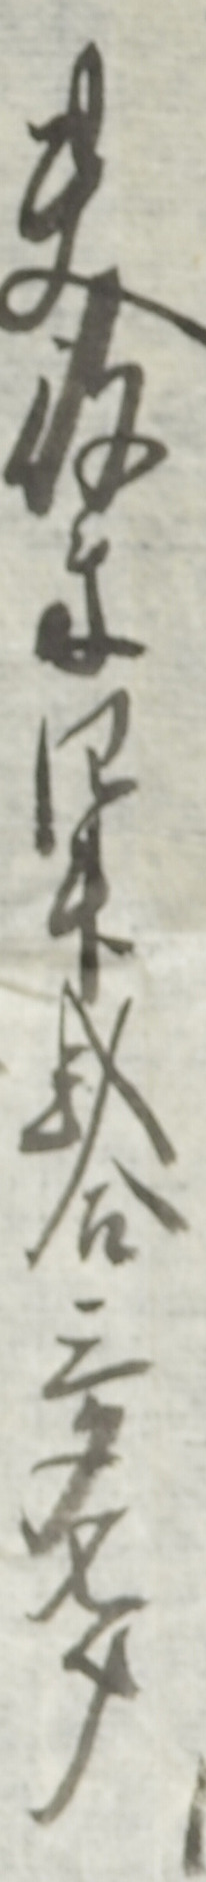夫役米四升弐合三勺七才
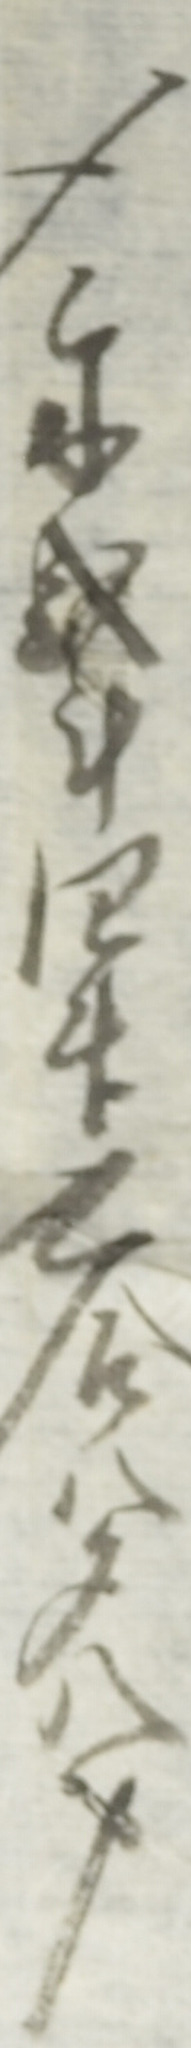〆米弐斗四升六合八勺八才
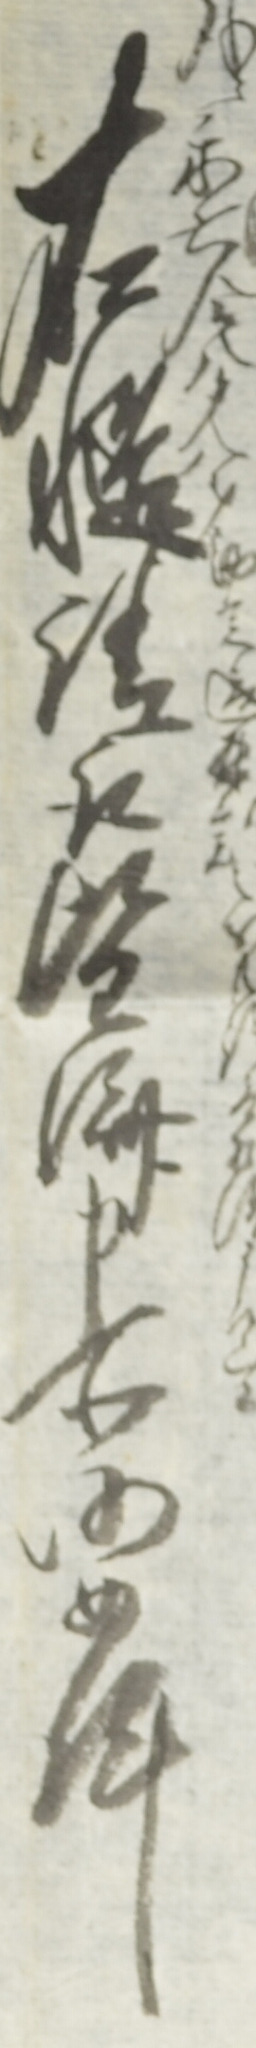右慥請取皆済申所仍如件
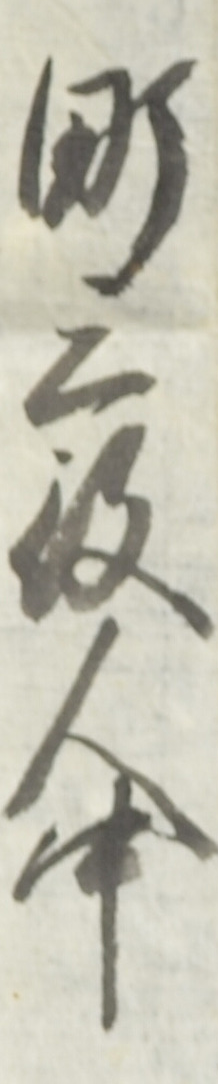町三役人中

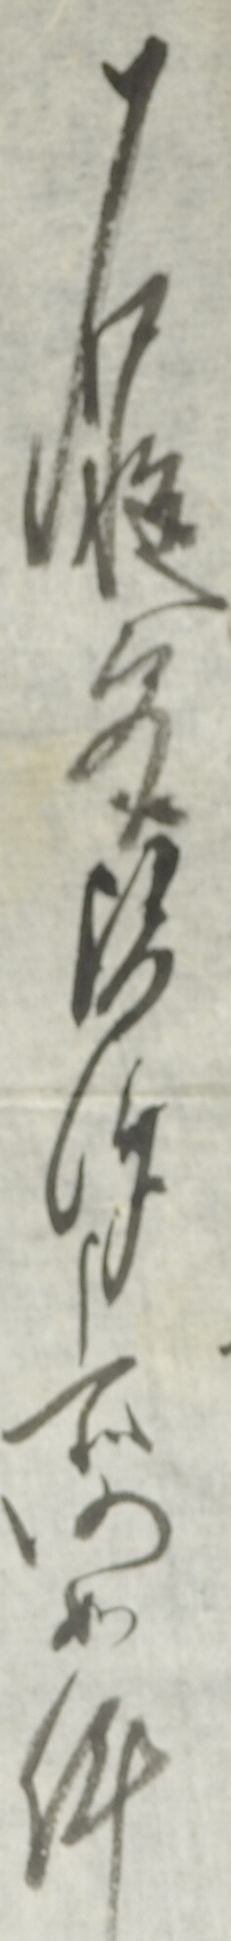右慥受取皆済申所仍如件
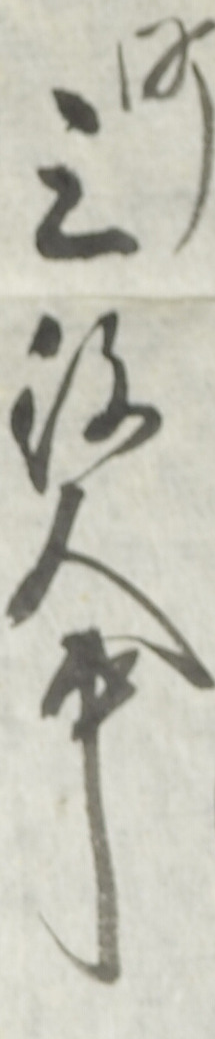三役人中

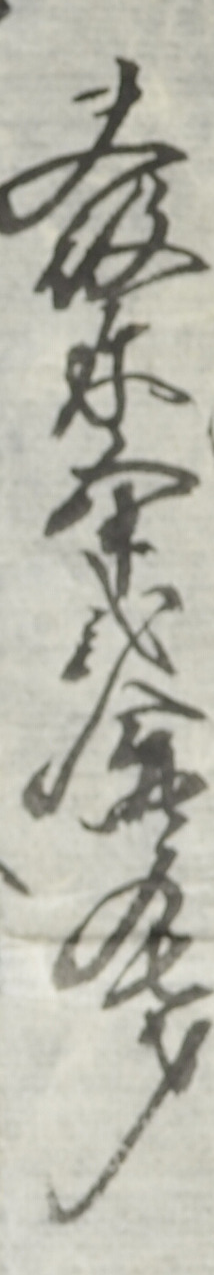夫役米五升弐合四勺七才
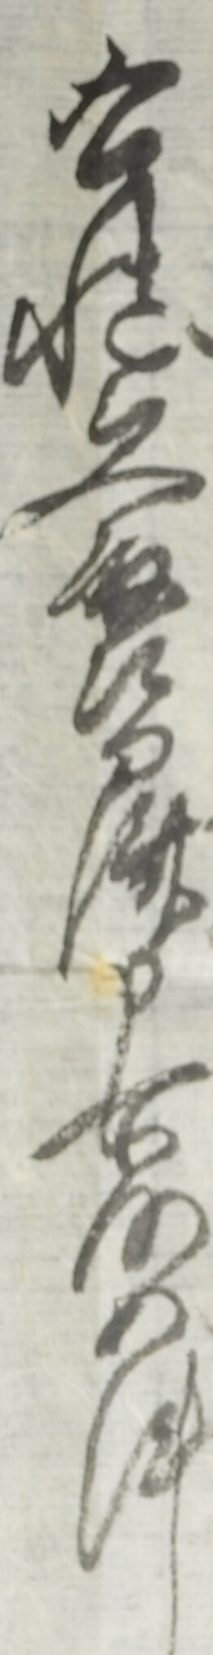右慥受取皆済申所仍如件
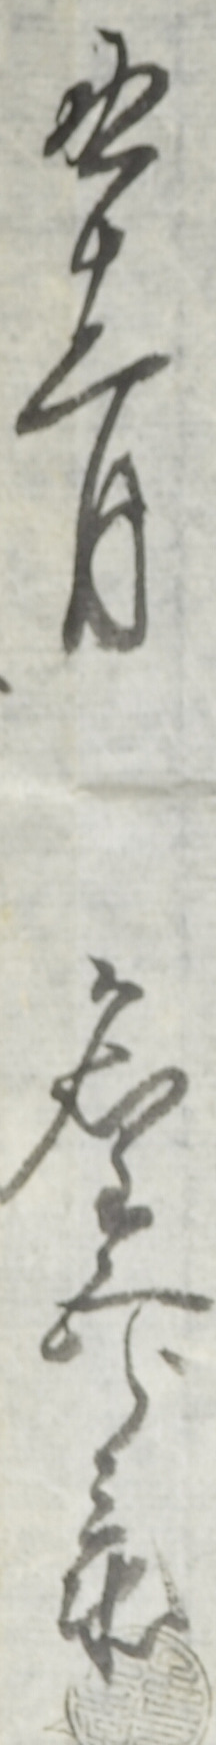丑十二月名主五郎兵衛㊞
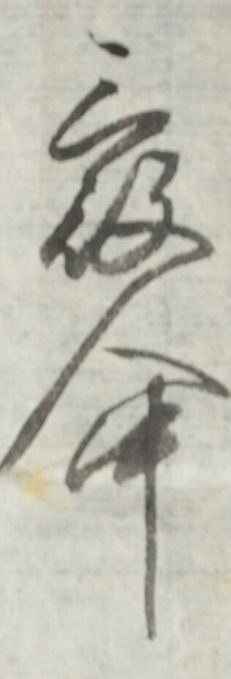三役人中

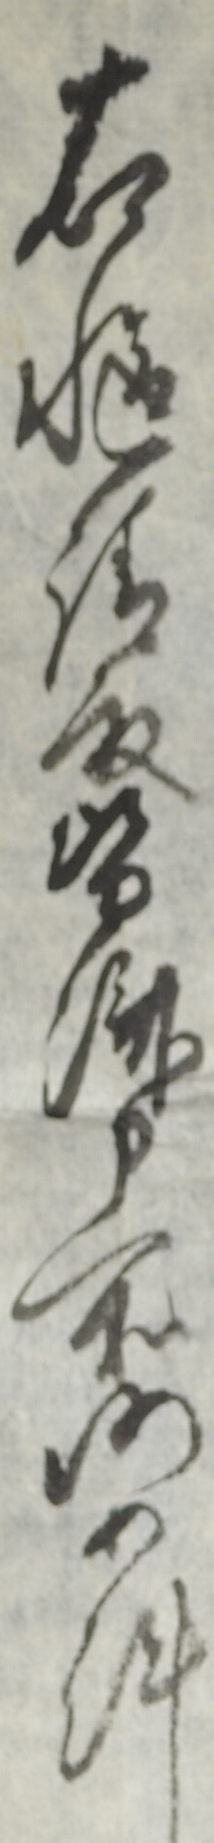右慥請取皆済申所仍如件
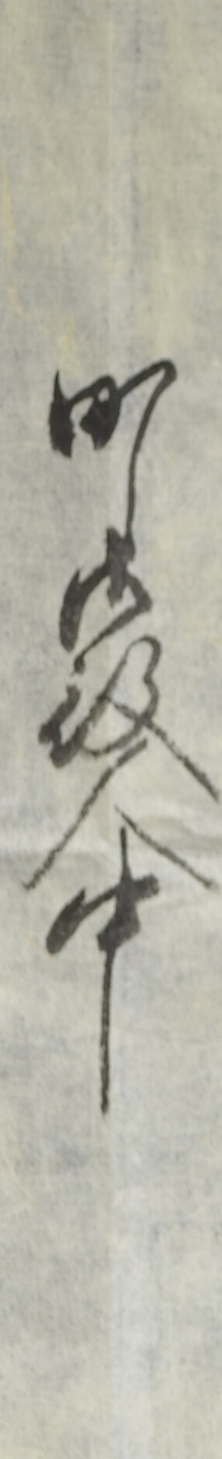町御役人中
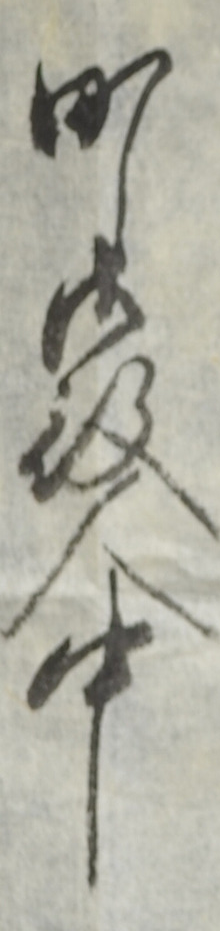町御役人中

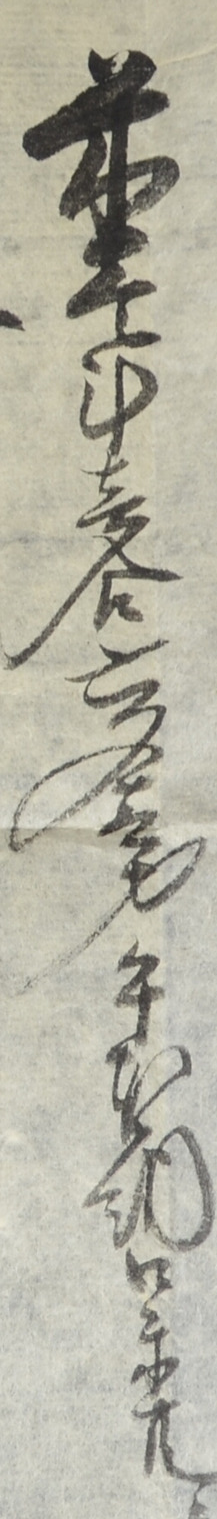米壱斗壱合六勺壱才午本納口米共ニ
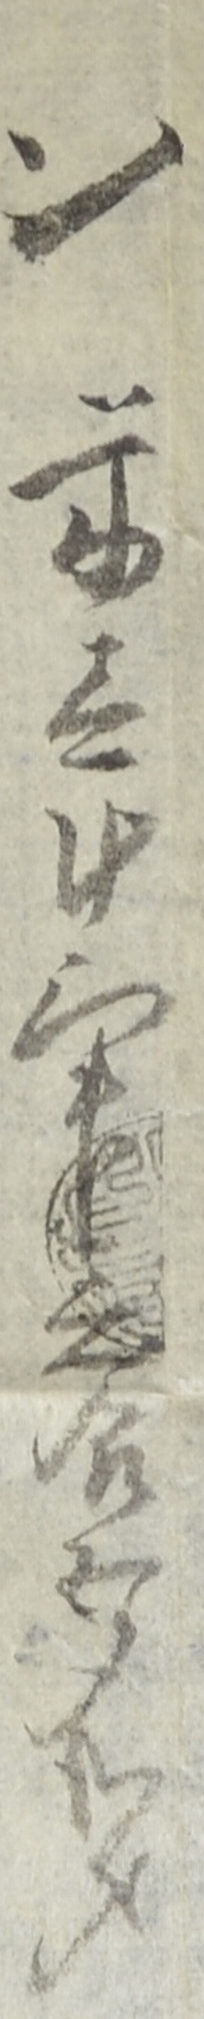〆米壱斗三升壱合五勺九才
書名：鉾持村皆済権現道附替畝歩書付
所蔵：伊那市立高遠町図書館・合同会社AMANE
